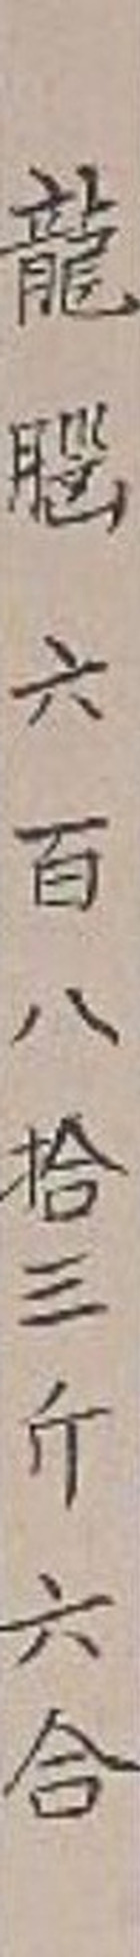龍腦六百八拾三斤六合
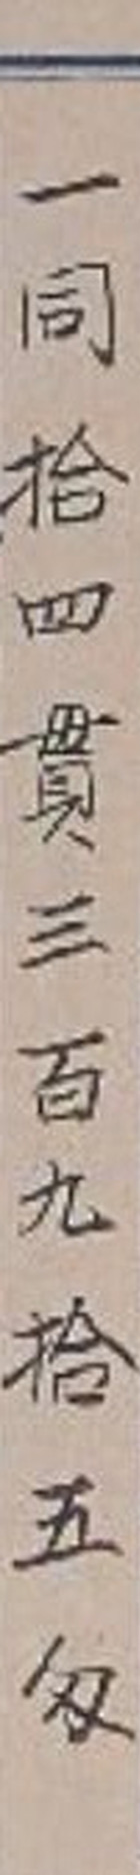一同四貫三百九拾五匁
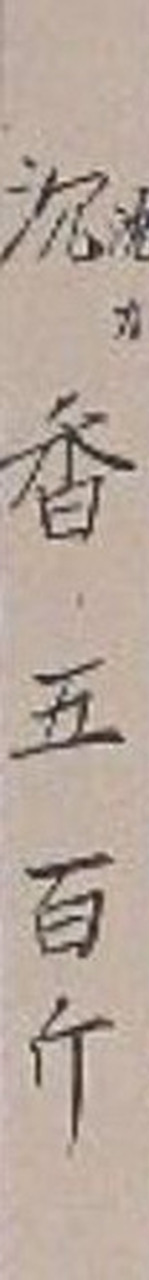沈香五百斤
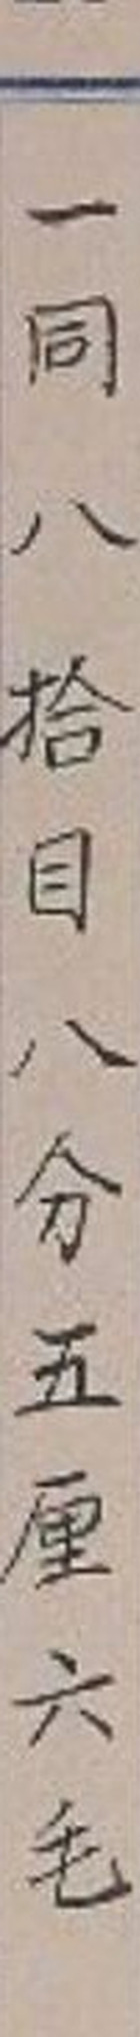一同八拾目八分五厘六毛
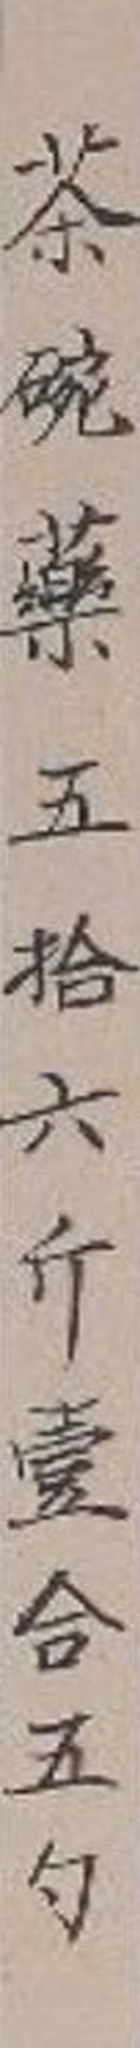茶碗藥五拾六斤壹合五勺

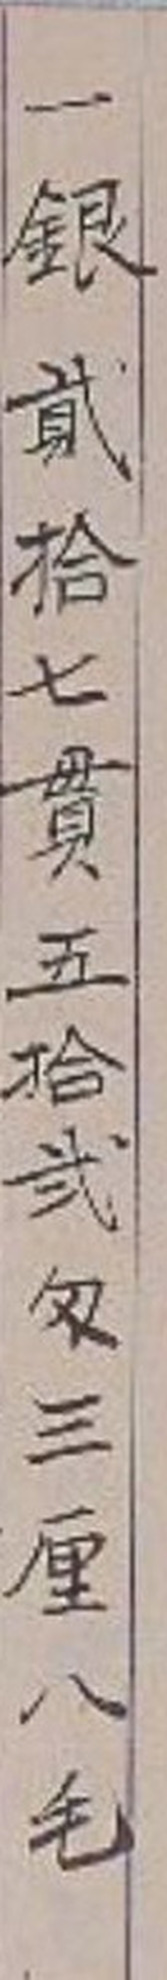一銀貳拾七貫五拾弐匁三厘八毛
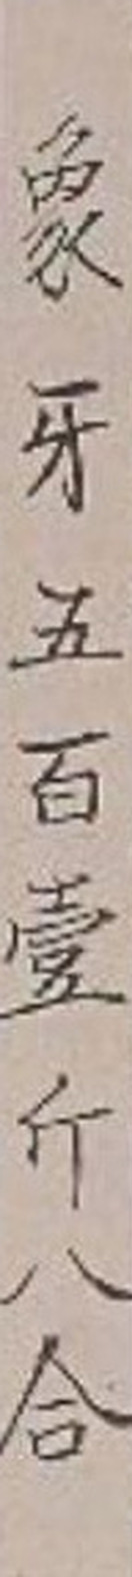象牙五百壹斤八合
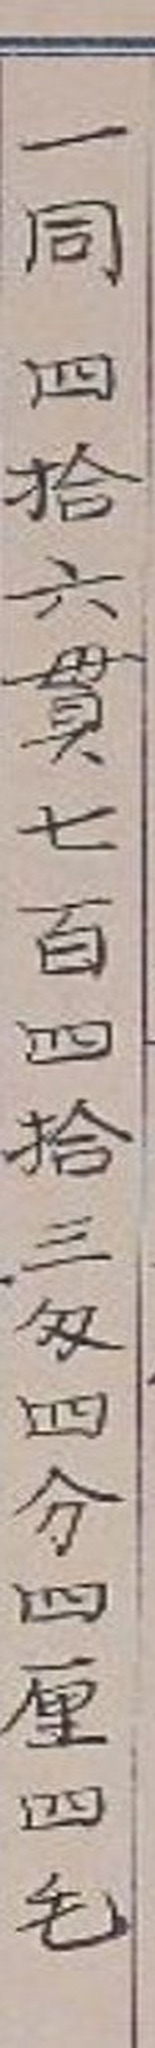一同四拾六貫七百四拾三匁四分四厘四毛
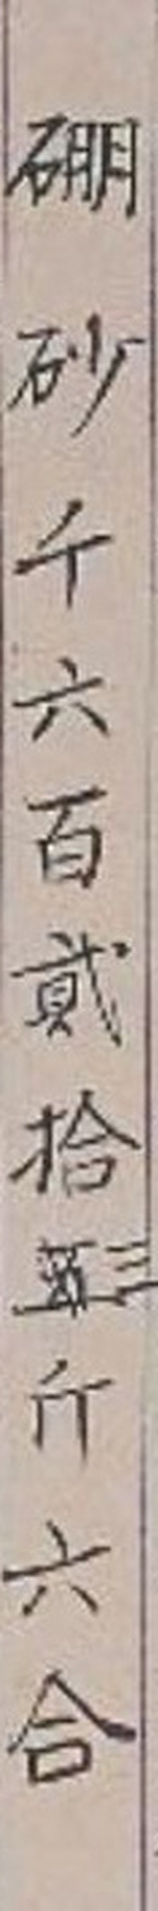硼砂千六百貳拾五斤六合
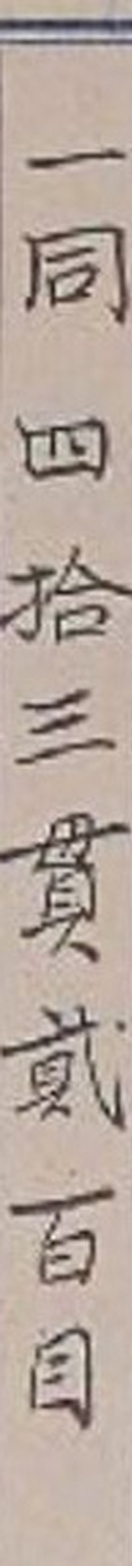一同四拾三貫貳百目
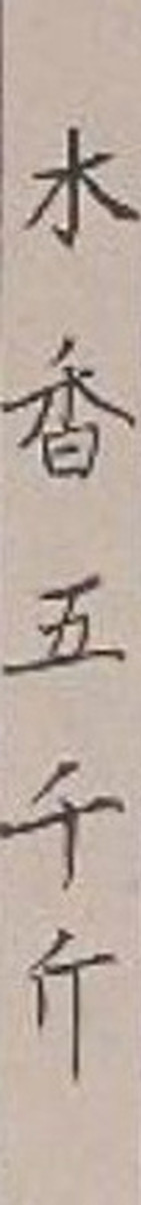木香五千斤
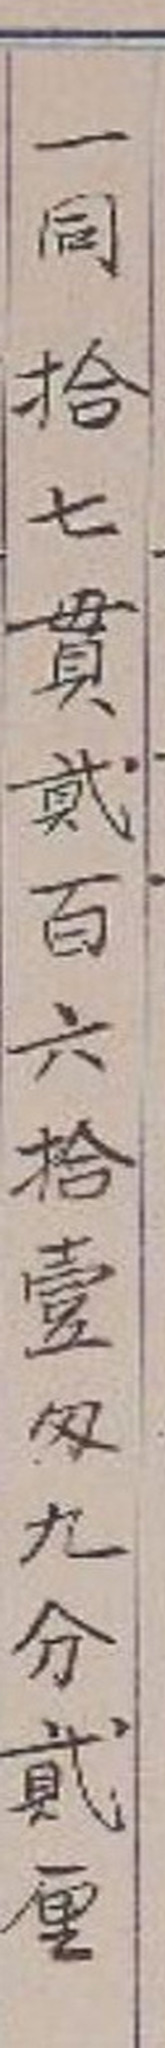一同拾七貫貳百六拾壹匁九分貳厘
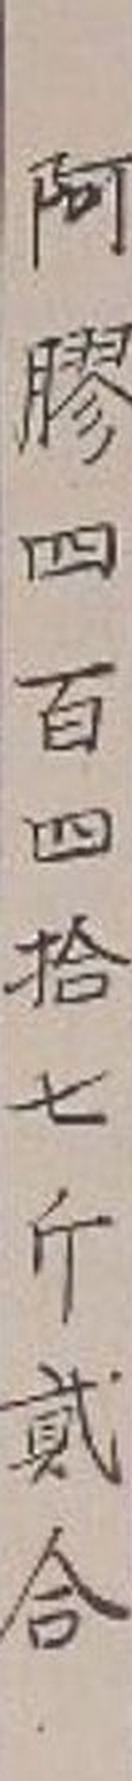阿膠四百四拾七斤貳合
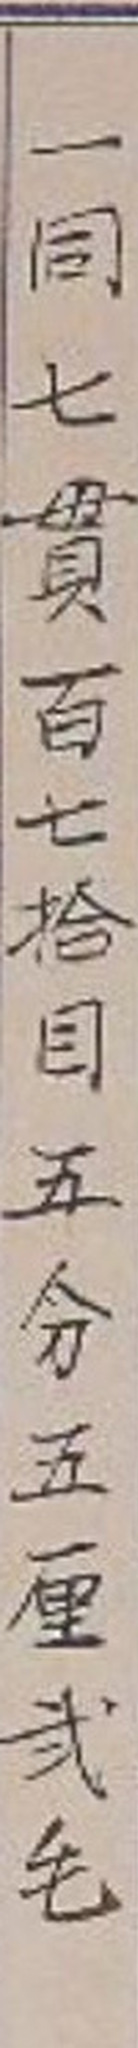一同七貫百七拾目五分五厘貳厘
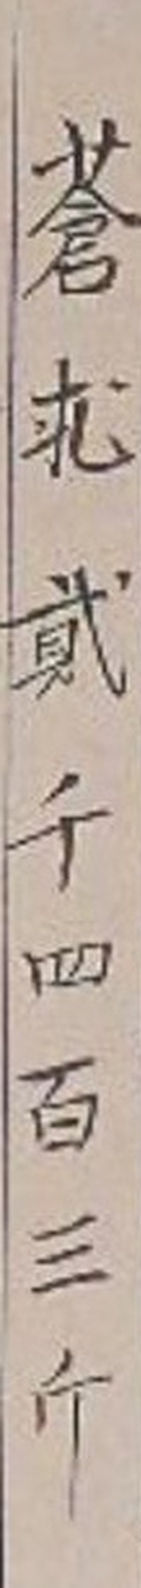蒼求貳千四百三斤
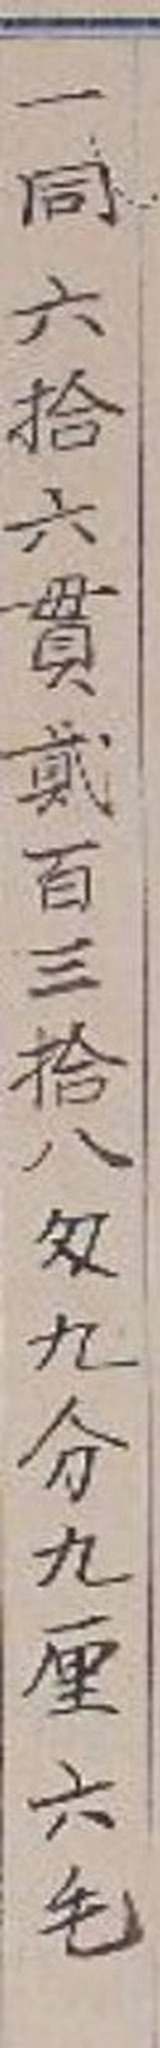一同六拾六貫貳百三拾八匁九分九厘六毛
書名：琉球産物於長崎拂立並本手品利潤総帖 弘化四年より酉年迄
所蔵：University of the Ryukyus Library
